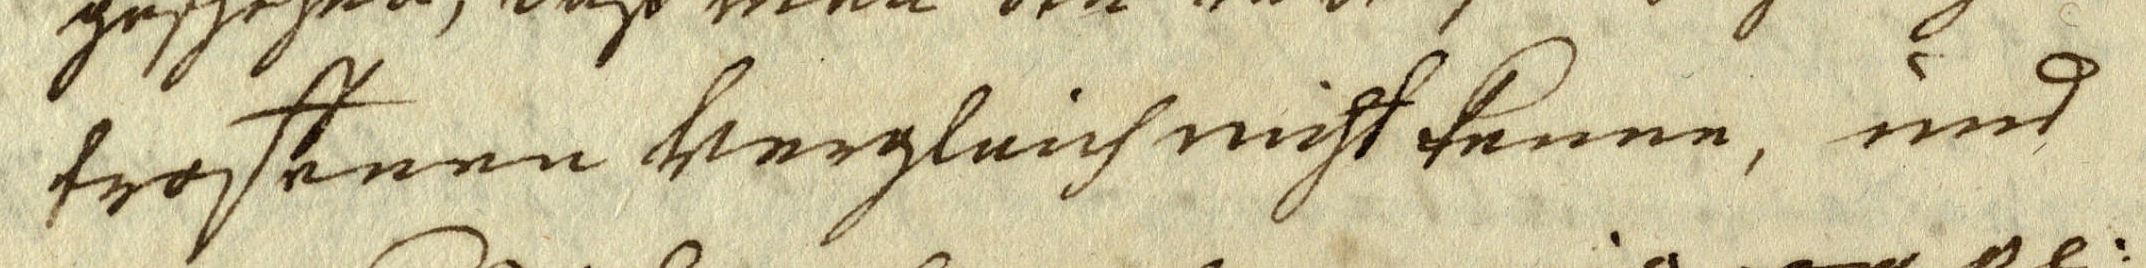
troffenen Vergleich nicht kenne, und
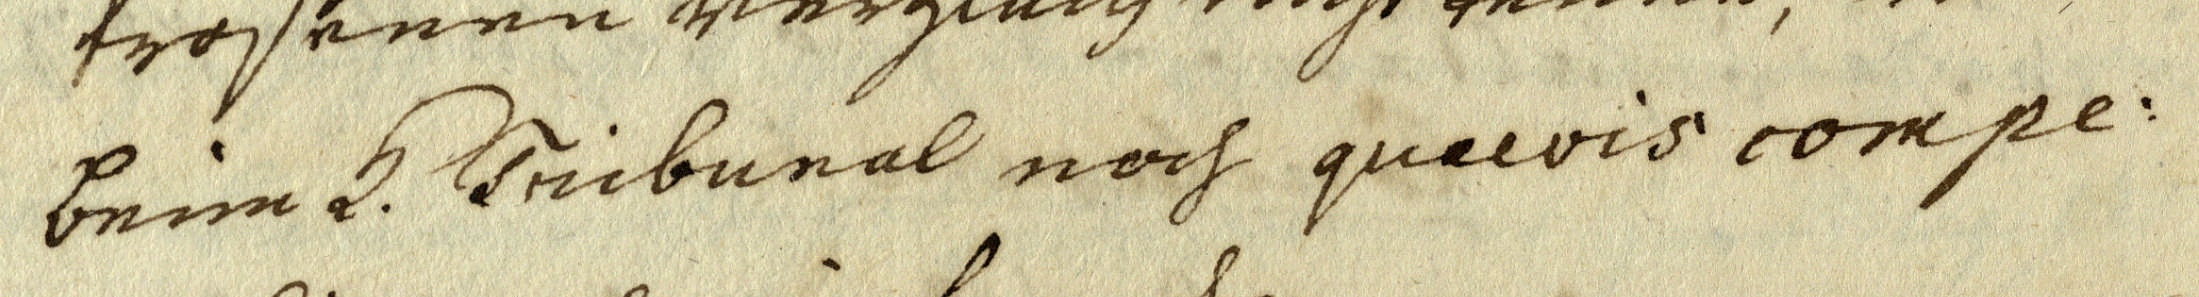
beim K. Tribunal noch quaevis compe¬
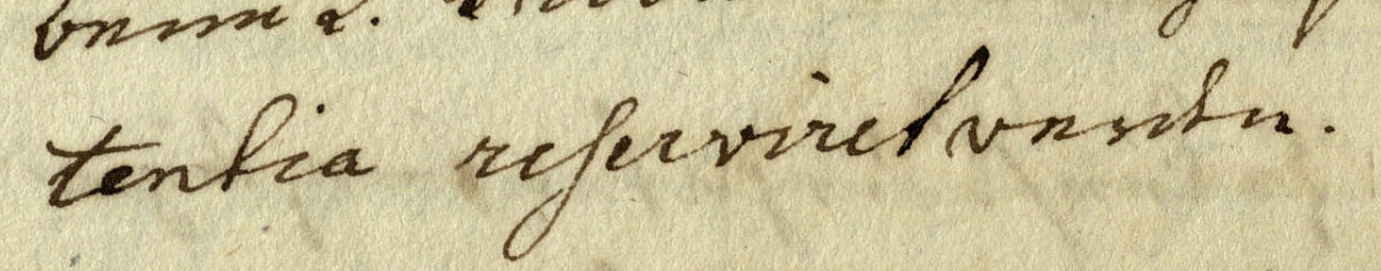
tentia reserviret werden.
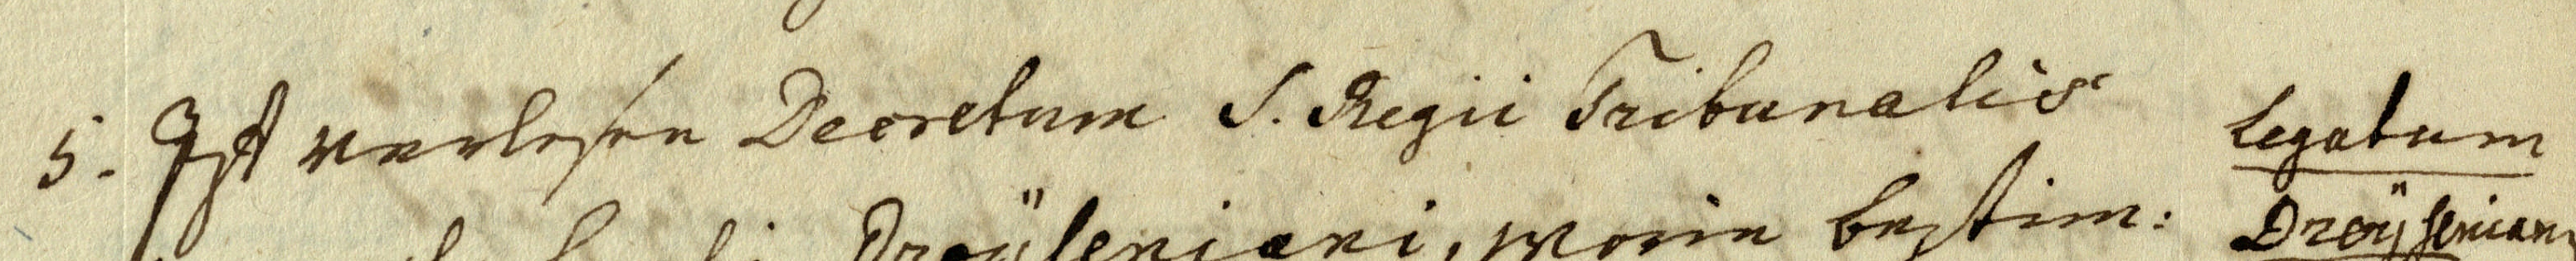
5. Ist verlesen Decretum S. Regii Tribunalis legatum
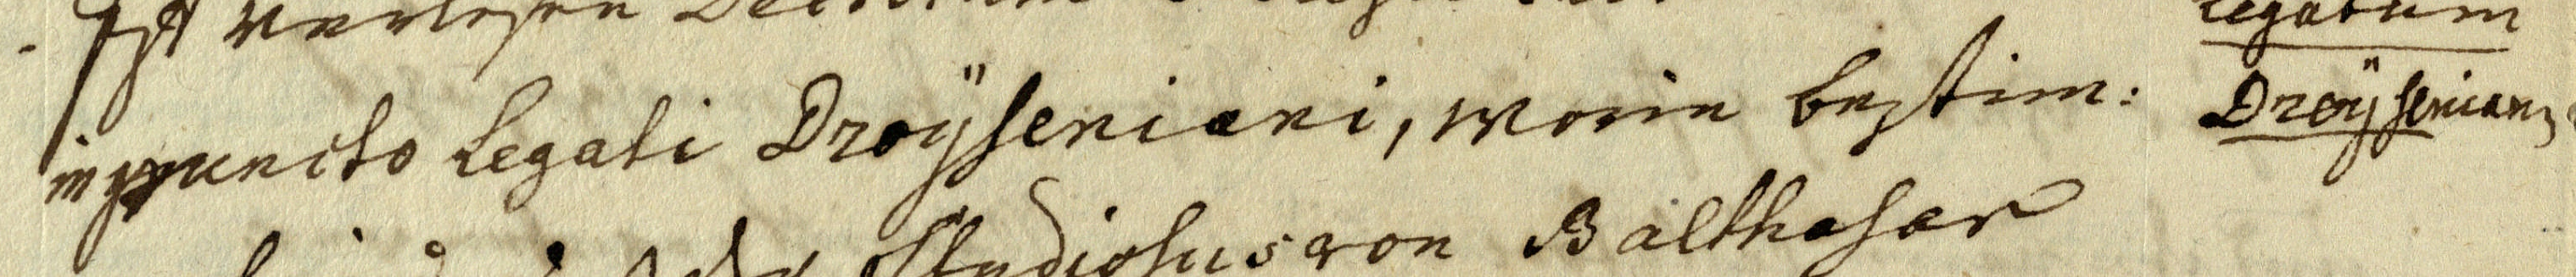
in puncto Legati Droÿseniani, worin bestim¬ Droÿseniani
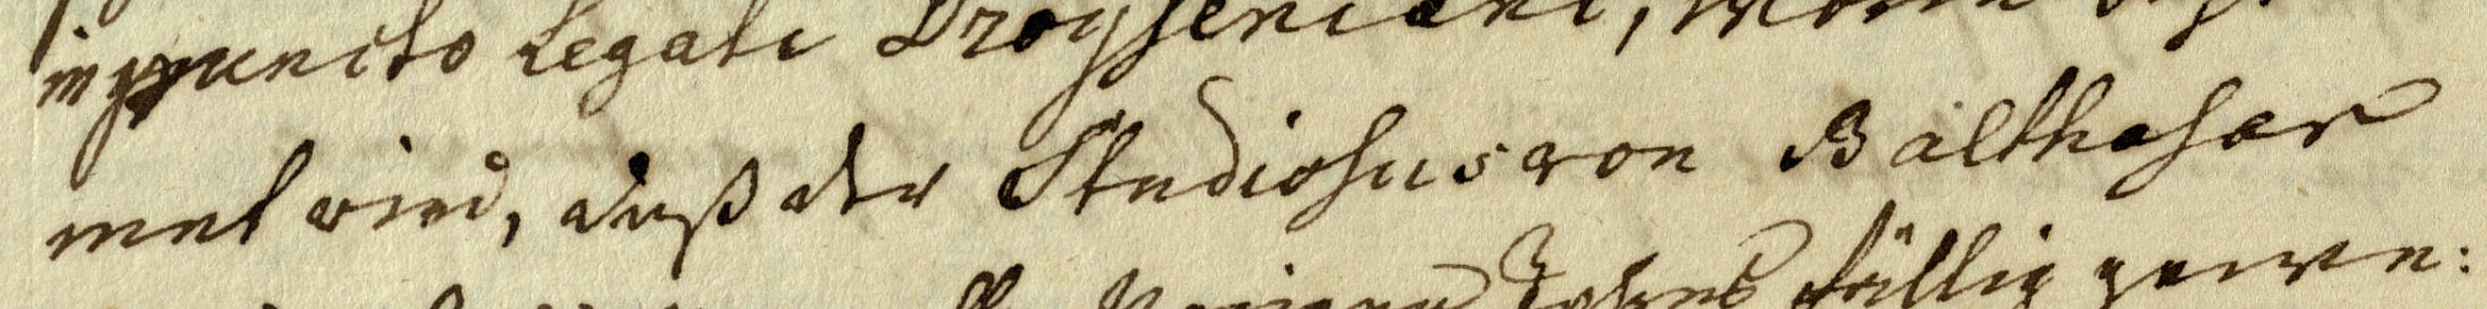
met wird, daß der Studiosus von Balthasar
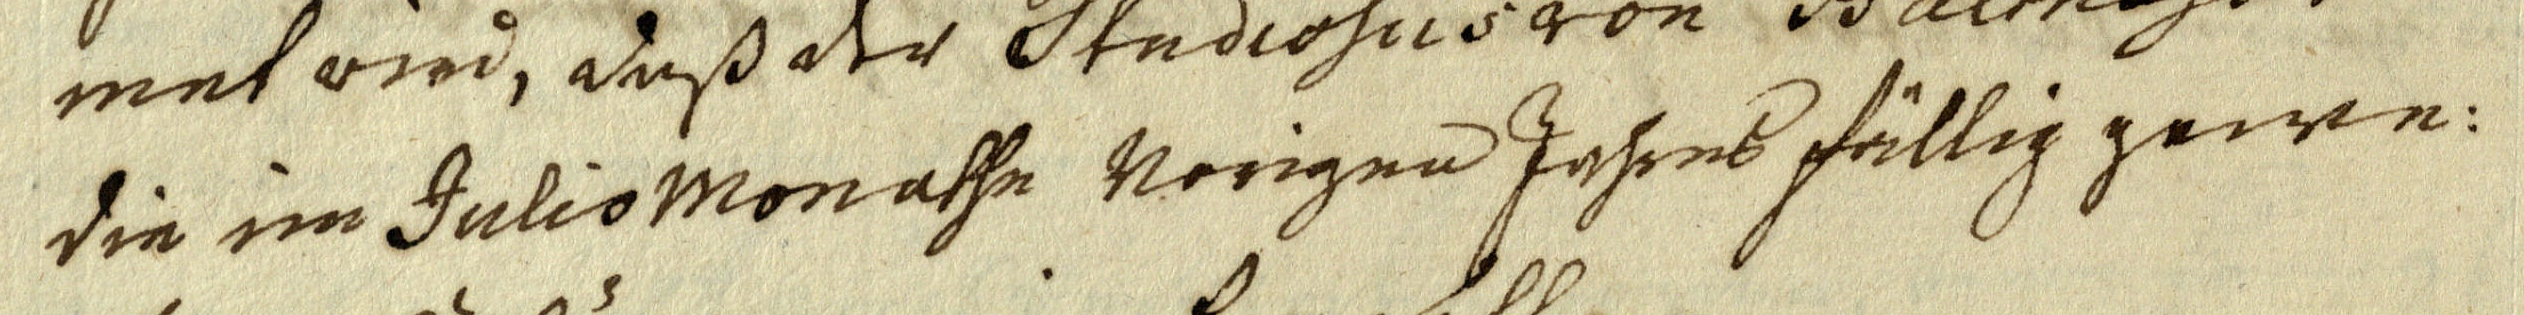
die im Julio Monathe vorigen Jahres fällig gewe¬
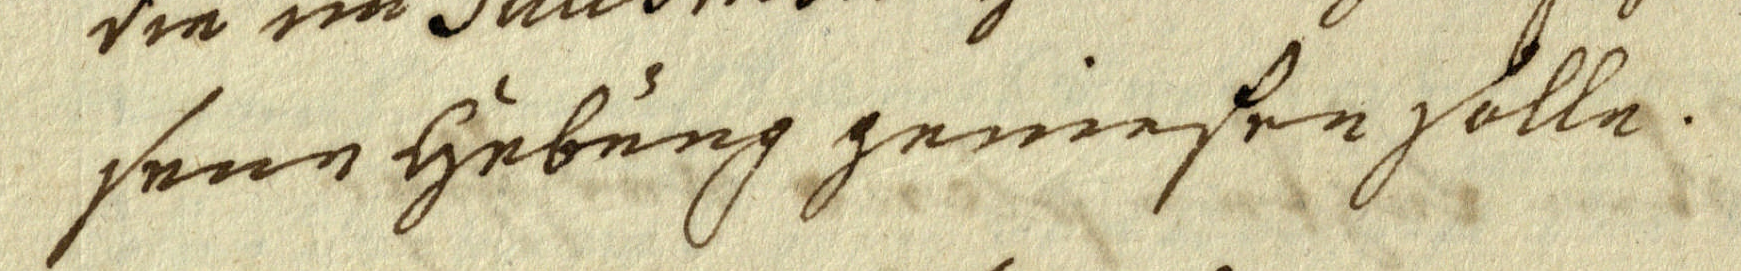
sene Hebung geniesen solle.
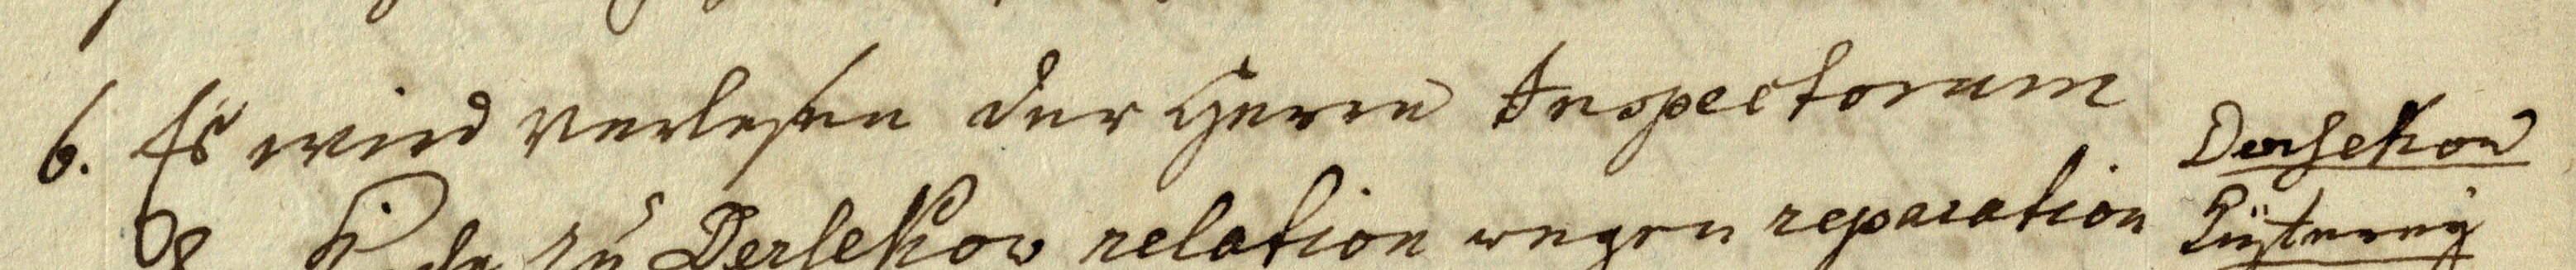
6. Es wird verlesen der Herrn Inspectorum Dersekow
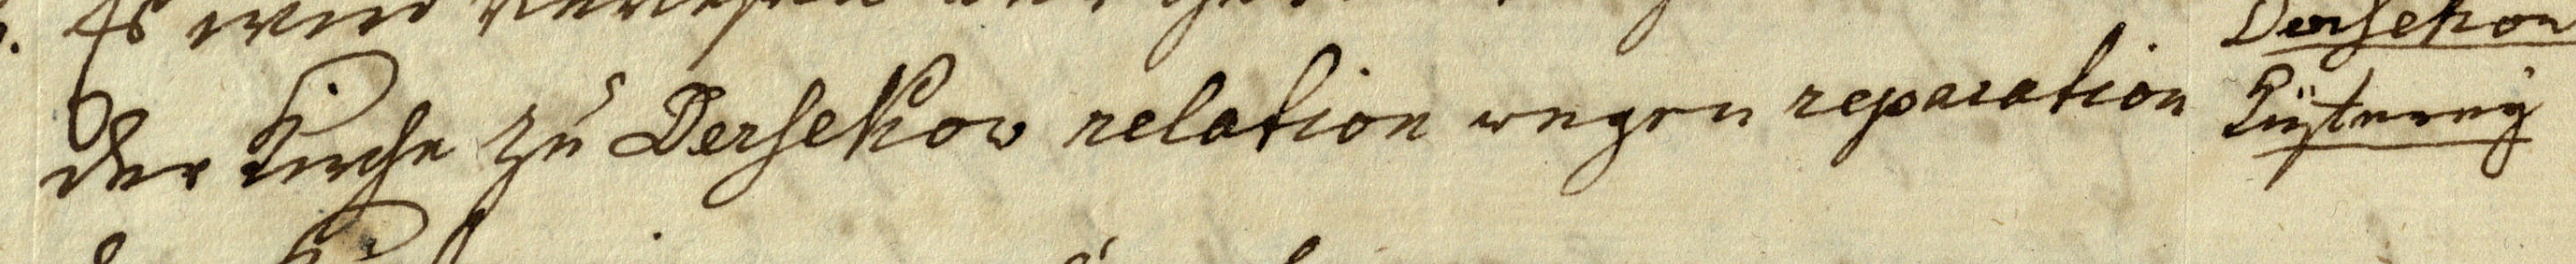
der Kirche zu Dersekow relation wegen reparation Küstereÿ
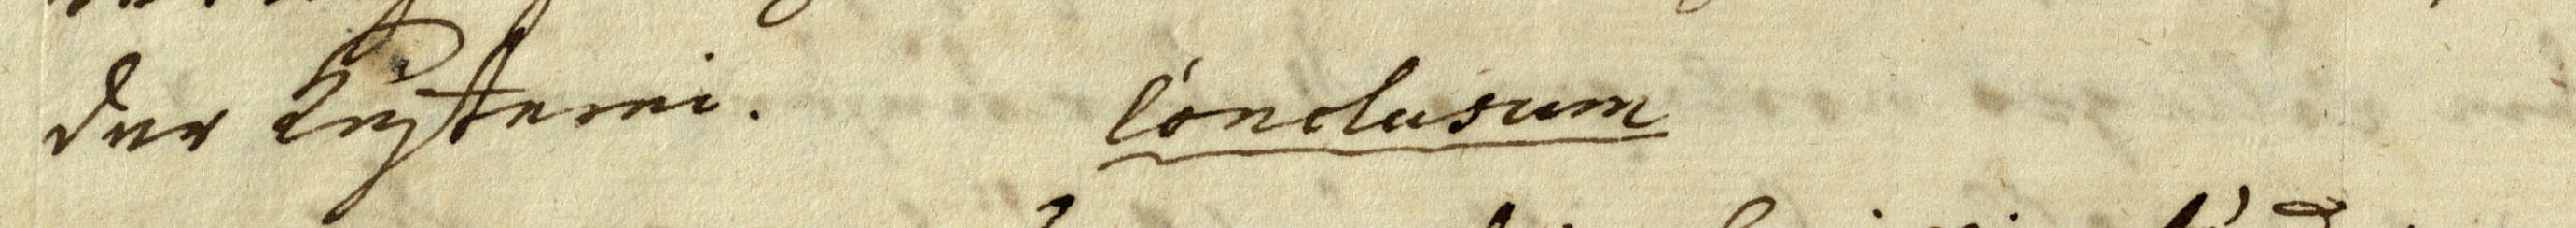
der Küsterei. Conclusum
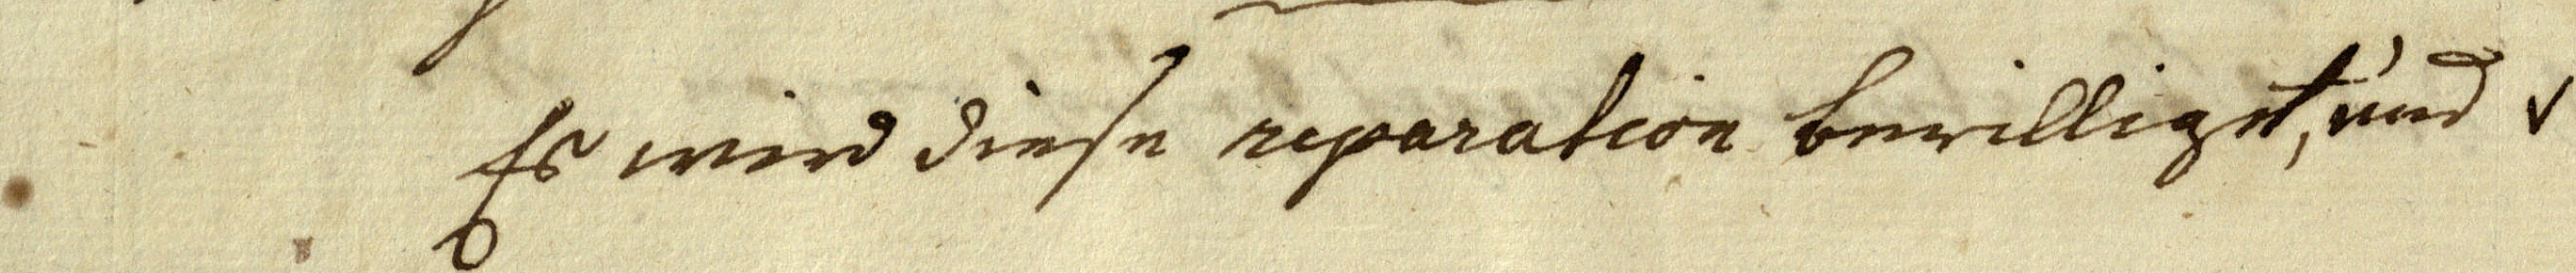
Es wird diese reparation bewilliget, und
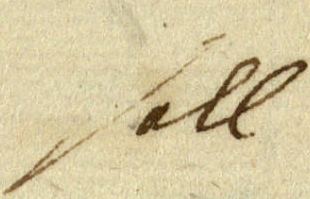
soll
